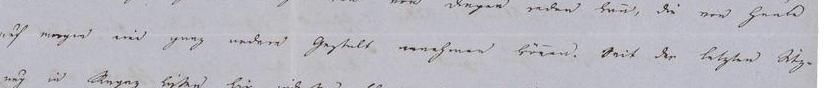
auf morgen eine ganz andere Gestalt annehmen können. Seit der letzten Sitz-
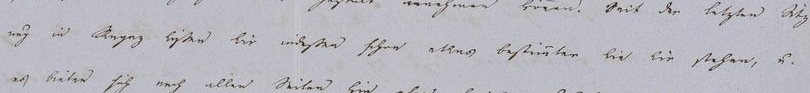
ung in Ragaz wißen wir indeßen schon etwas bestimmter wie wir stehen, u.
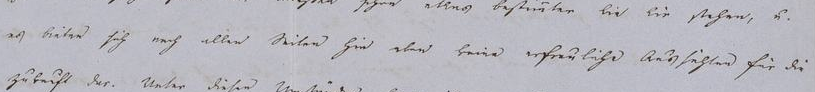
es bieten sich nach allen Seiten hin eben keine erfreuliche Aussichten für die
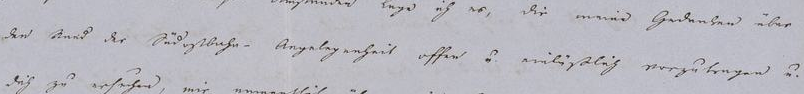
den Stand der Südostbahn-Angelegenheit offen u. einläßlich vorzutragen u.
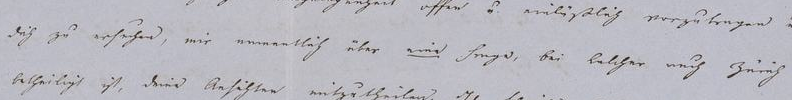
Dich zu ersuchen, mir namentlich über eine Frage, bei welcher auch Zürich
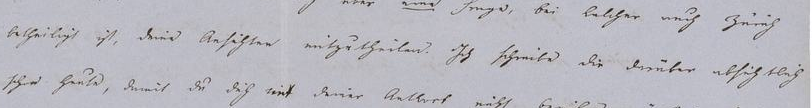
betheiligt ist, Deine Ansichten mitzutheilen. Ich schreibe Dir darüber absichtlich
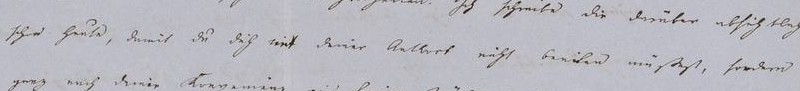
schon heute, damit Du Dich mit Deiner Antwort nicht beeilen müßest, sondern
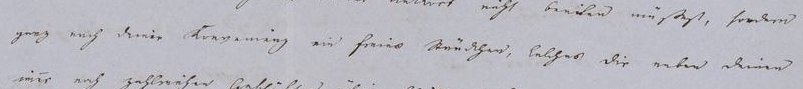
ganz nach Deiner Konvenienz ein freies Stündchen, welches Dir neben Deinen
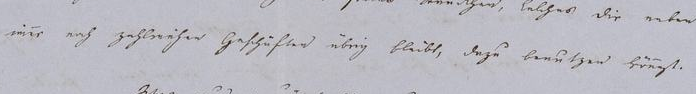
immer noch zahlreichen Geschäften übrig bleibt, dazu benutzen könnest.
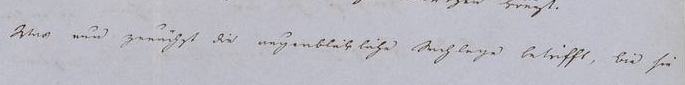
Was nun zunächst die augenblickliche Sachlage betrifft, wie sie
